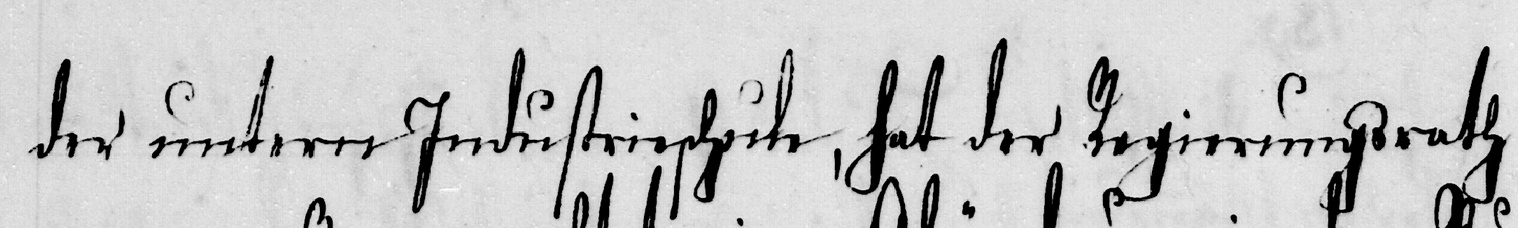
der untern Industrieschule, hat der Regierungsrath
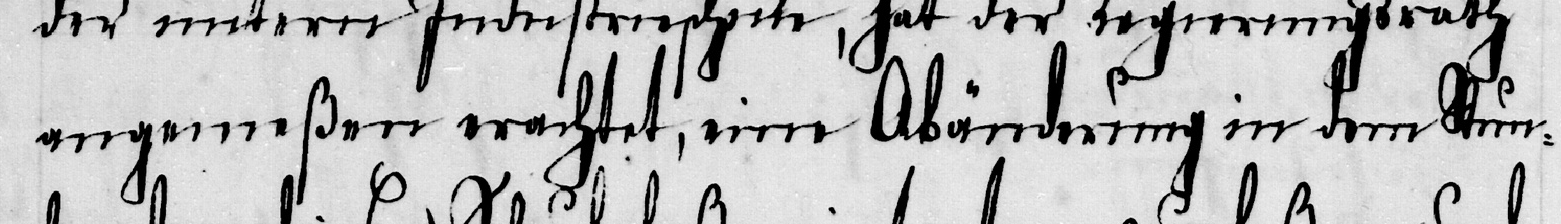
angemeßen erachtet, eine Abänderung in dem Stun¬
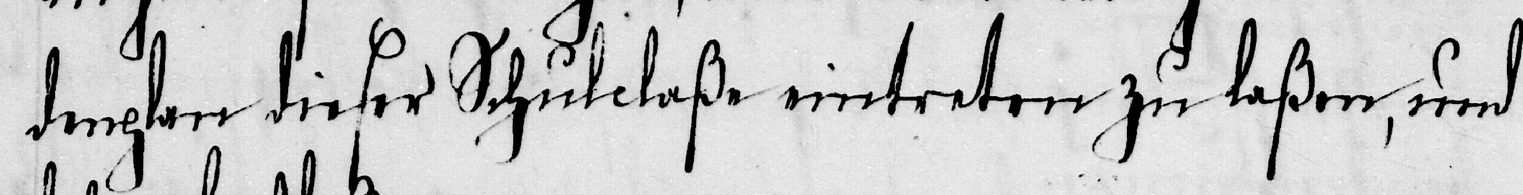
denplan dieser Schulclaße eintreten zu laßen, und
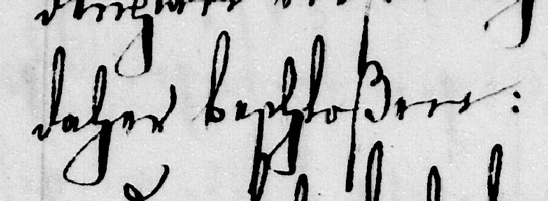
daher beschloßen
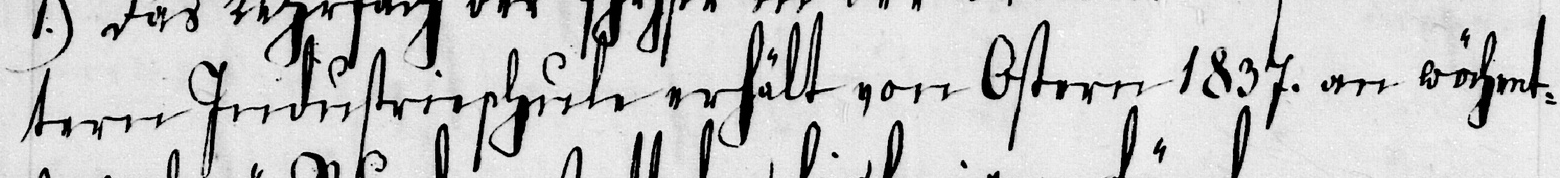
tern Industrieschule erhält von Ostern 1837. an wöchent¬
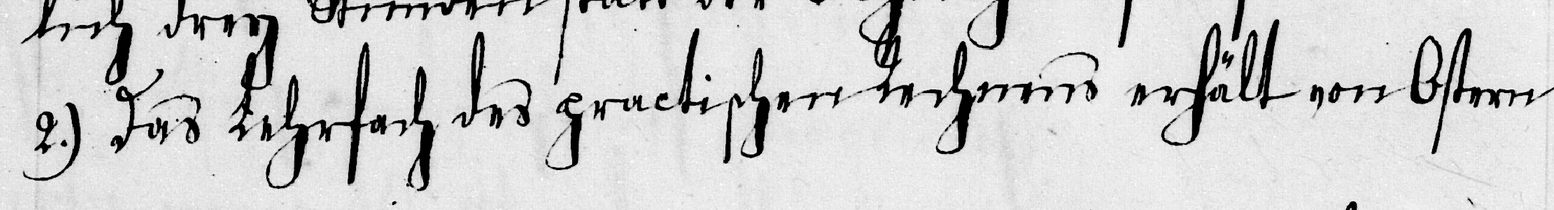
2.) Das Lehrfach des practischen Rechnens erhält von Ostern
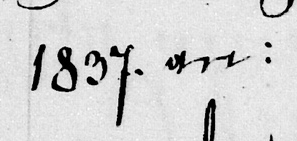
1837. an:
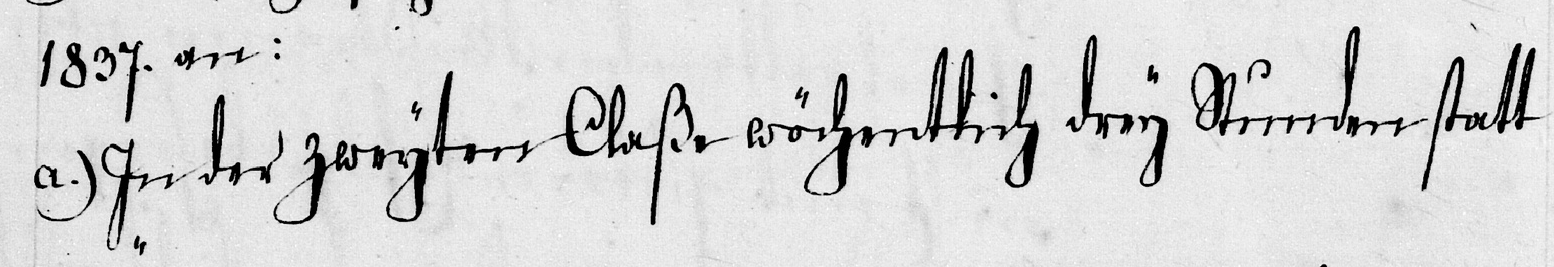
a.) In der zweyten Claße wöchentlich drey Stunden statt
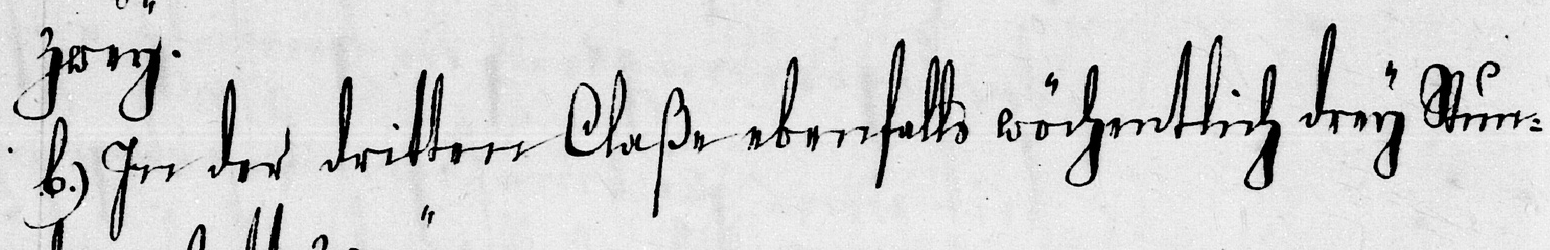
b.) In der dritten Claße ebenfalls wöchentlich drey Stun¬
